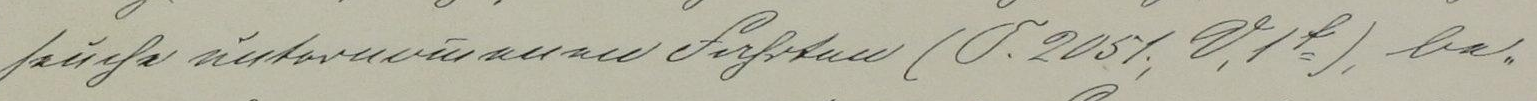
seuche unternommenen Fahrten (T.2051; V.1f), be-
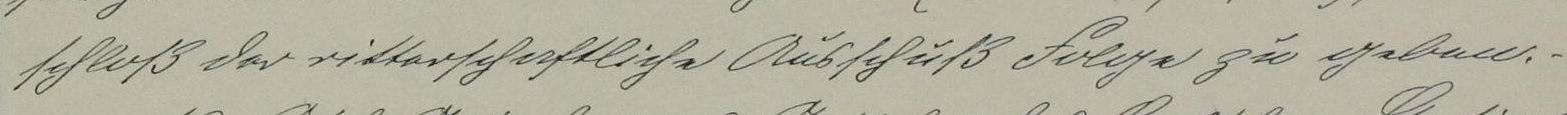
schloß der ritterschaftliche Ausschuß Folge zu geben.
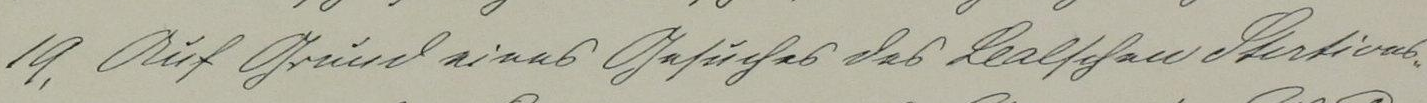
19. Auf Grund eines Gesuches des Lealschen Stations-
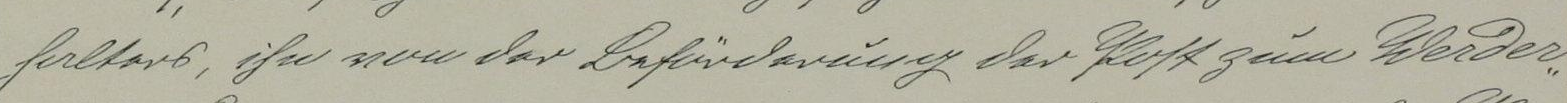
halters, ihn von der Beförderung der Post zum Werder-
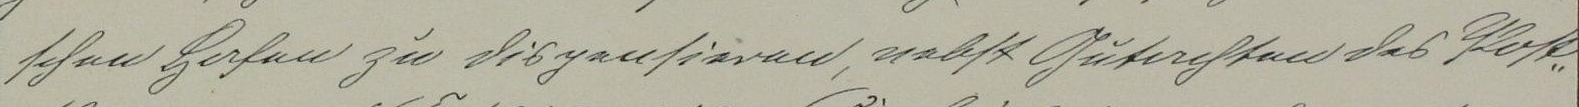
schen Hafen zu dispensieren, nebst Gutachten des Post-
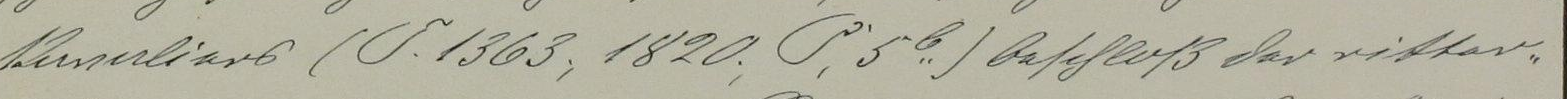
kavaliers (T.1363, 1820; P.5b) beschloß der ritter-
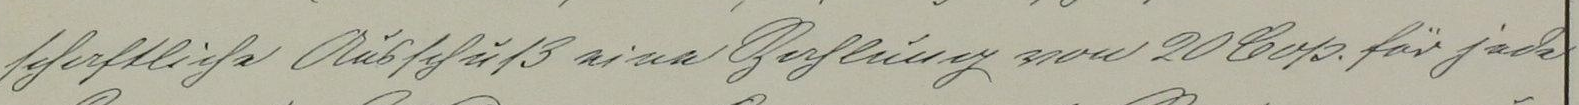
schaftliche Ausschuß eine Zahlung von 20 Cop. für jede
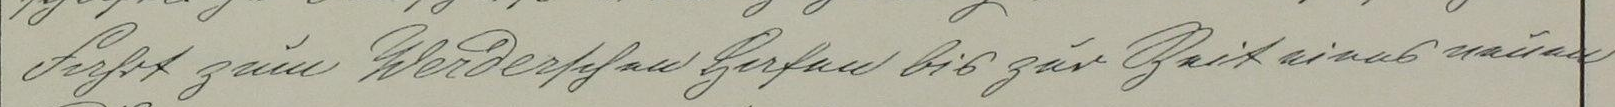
Fahrt zum Werderschen Hafen bis zur Zeit eines neuen
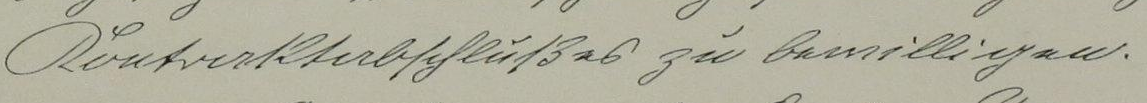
Kontraktabschlußes zu bewilligen.
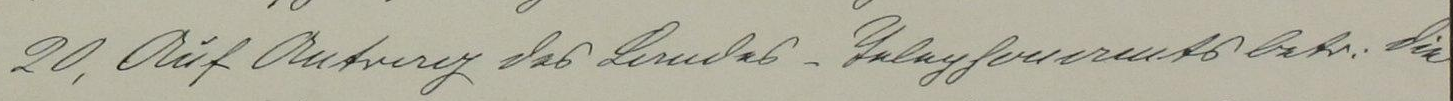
20. Auf Antrag des Landes-Telephonamts betr. die
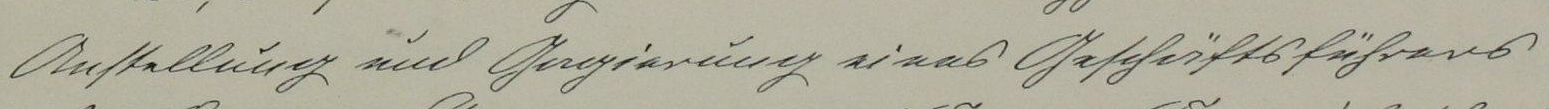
Anstellung und Gagierung eines Geschäftsführers
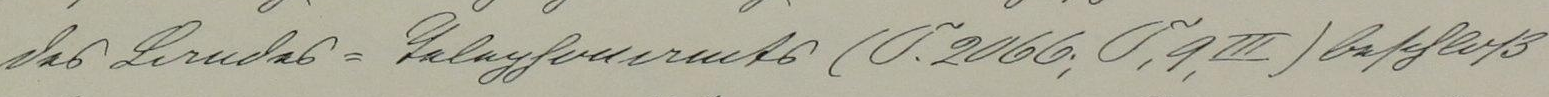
des Landes-Telephonamts (T.2066; T.9,III) beschloß
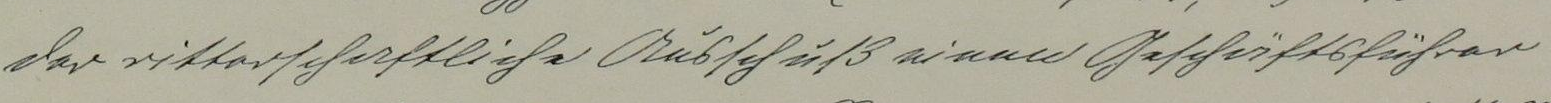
der ritterschaftliche Ausschuß einen Geschäftsführer
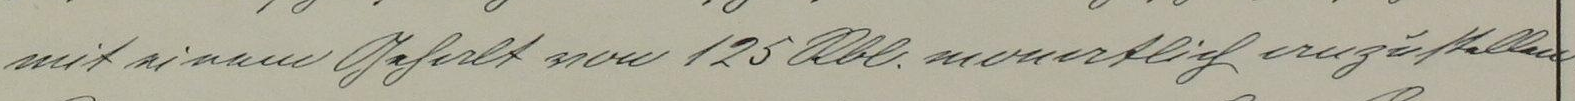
mit einem Gehalt von 125 Rbl. monatlich anzustellen.
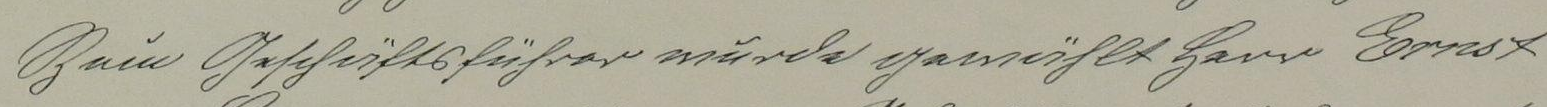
Zum Geschäftsführer wurde gewählt Herr Ernst
